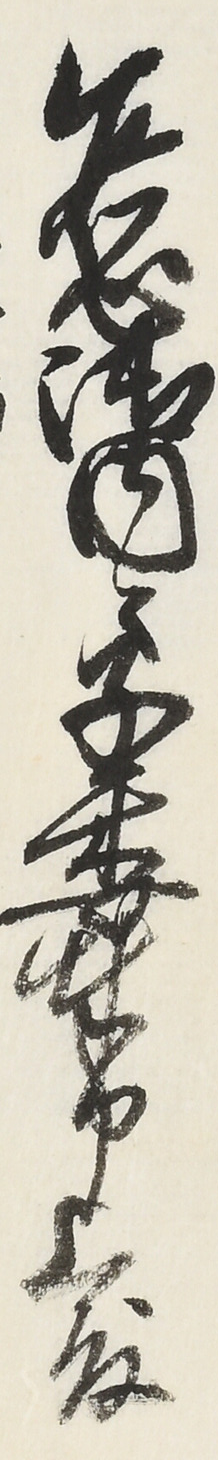乍恐御内々子委奉申上敷
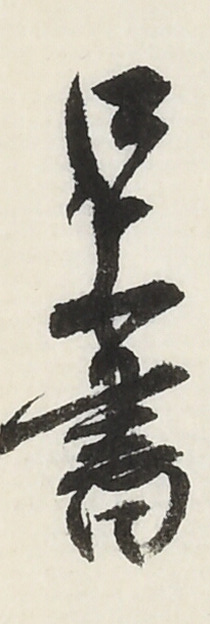口上書
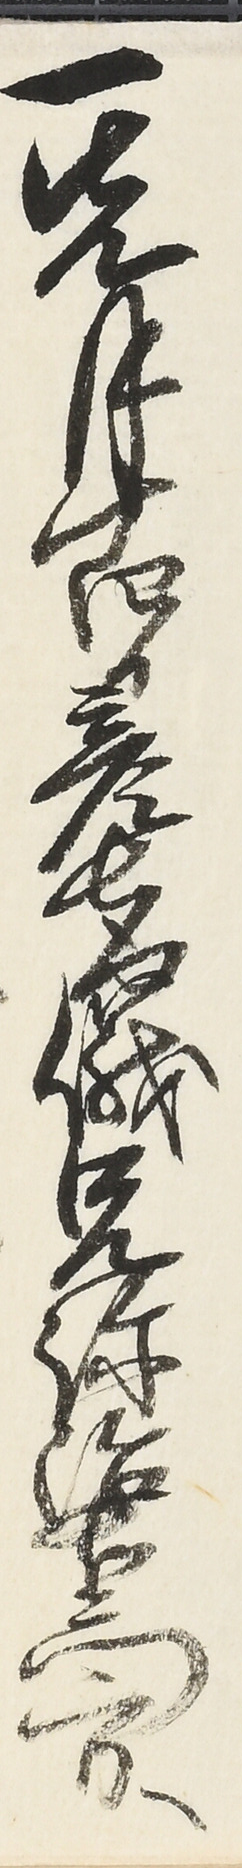一先月十四日彦右衛門俄兄弥治右衛門方へ
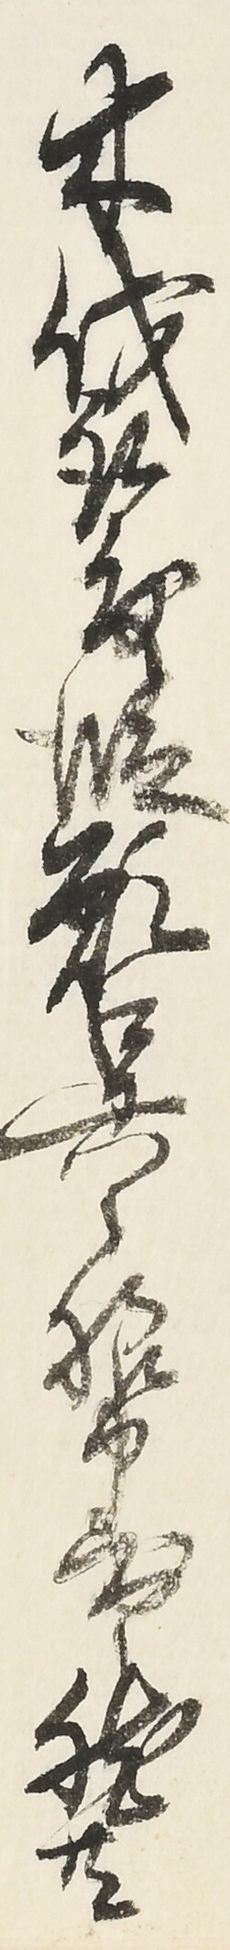木伐取度段願呉候様申出候然共
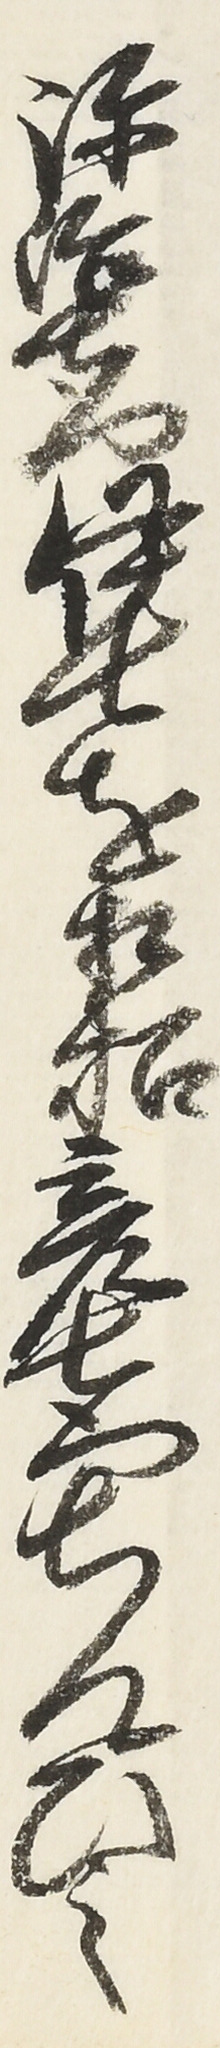弥治右衛門伊七を相招彦右衛門ちんひ之
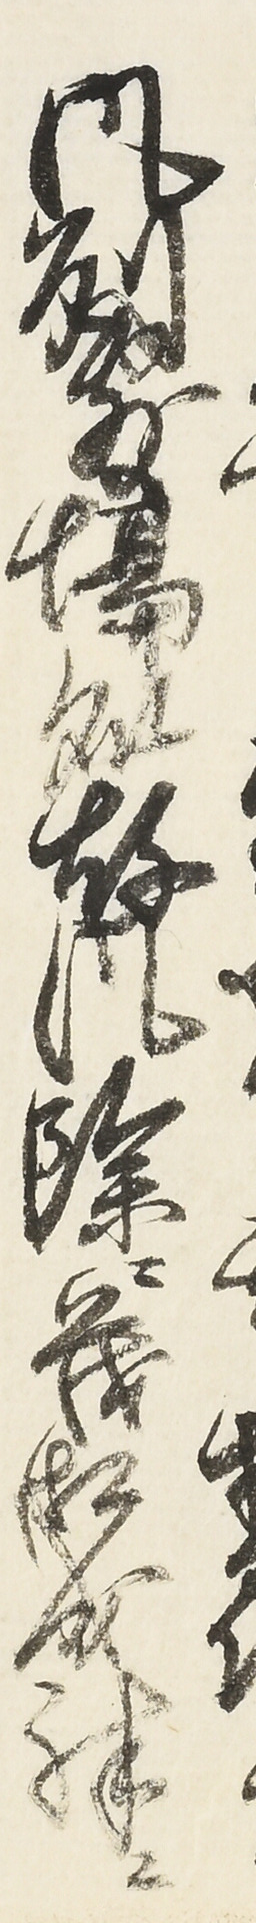風列敷場処故風除ニ茂相成殊ニ
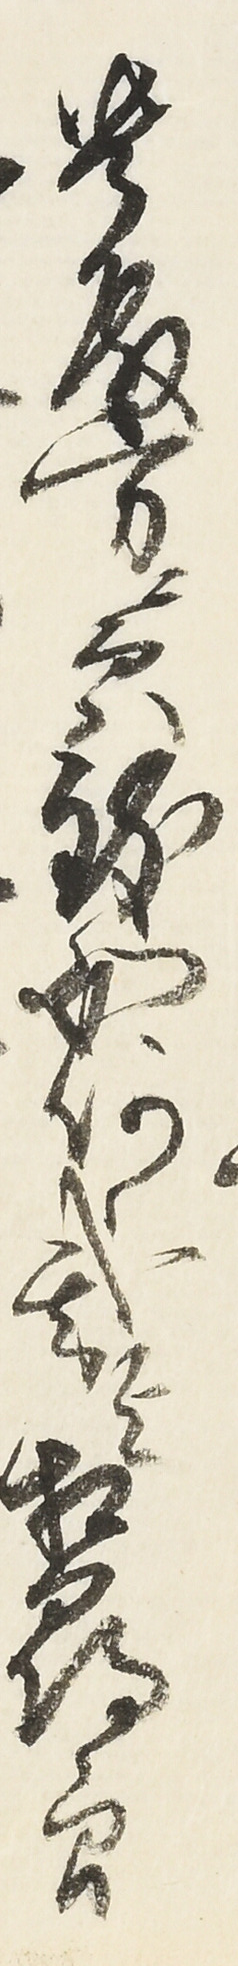貴殿方ニ而ハ致如何候哉と尋候間
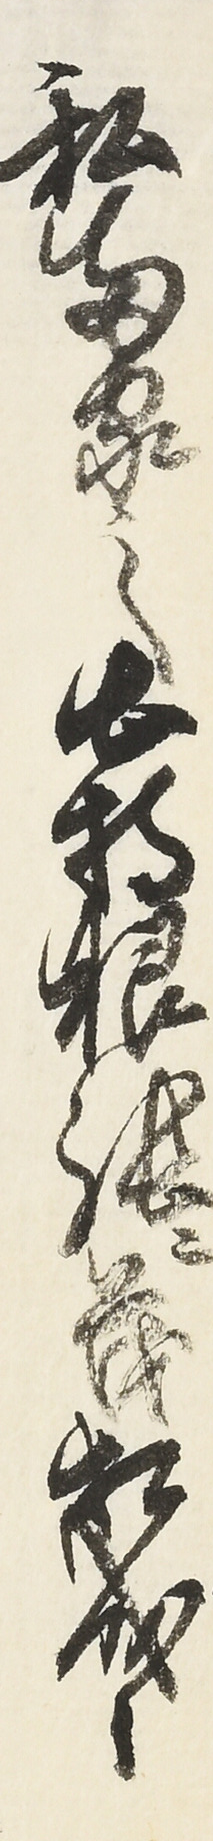私両家之土持根張ニ茂相成候
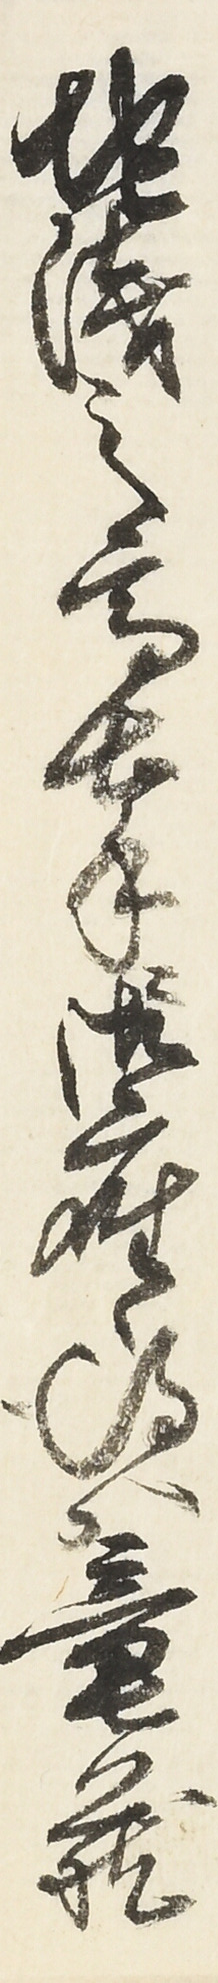地浅之高土手ニ御座候得ハ竜蔵
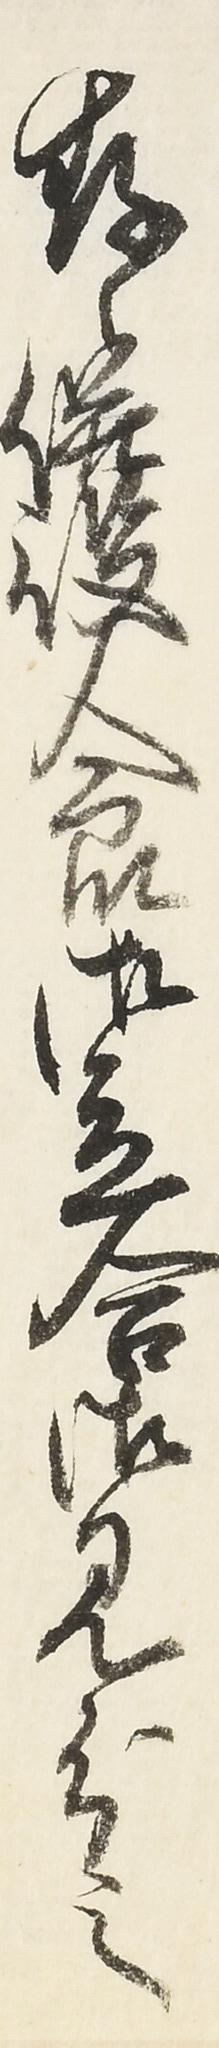存候併役人衆御立会御見分之
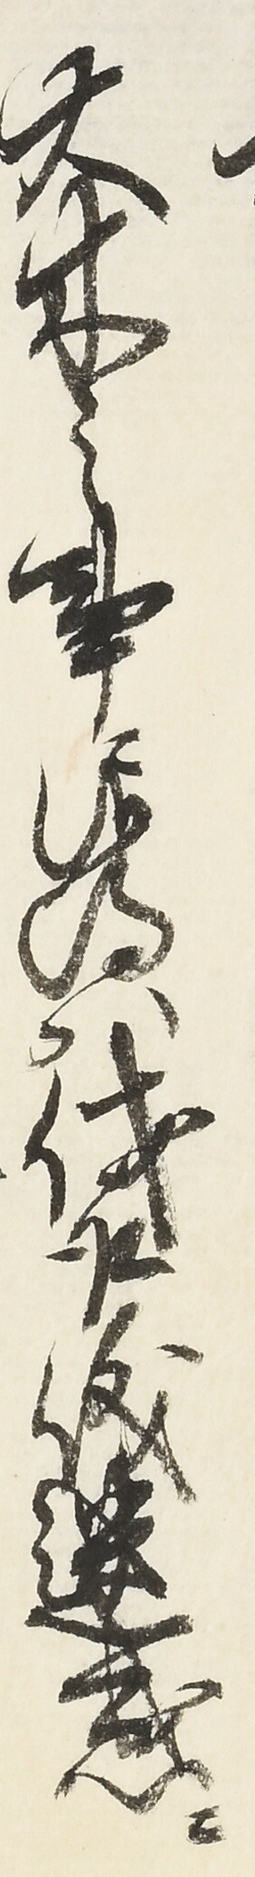大木之事ニ候得ハ伐取儀迷惑ニ
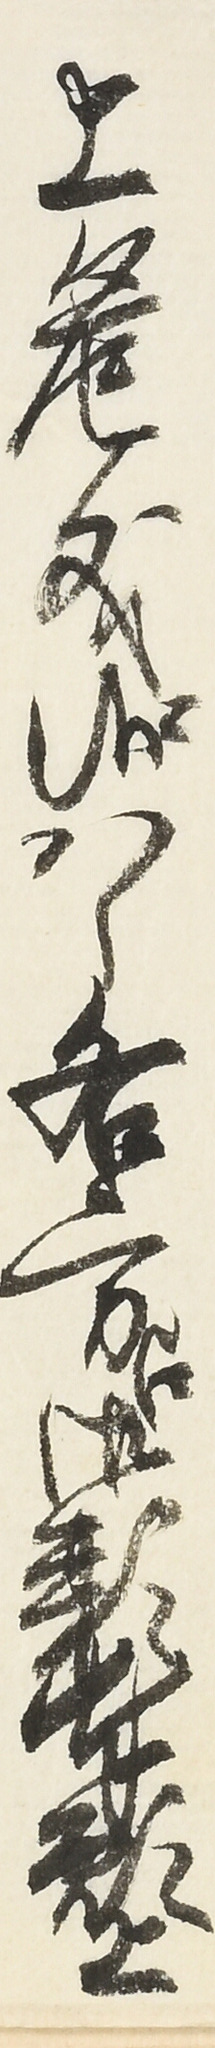上危義ニ候ハバ各方江御頼奉願上
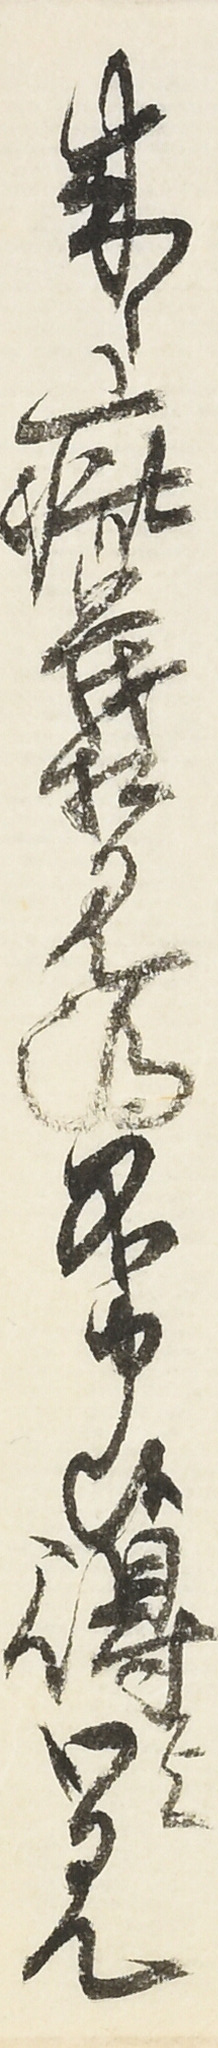来候疵茂相見得不申候得与御見
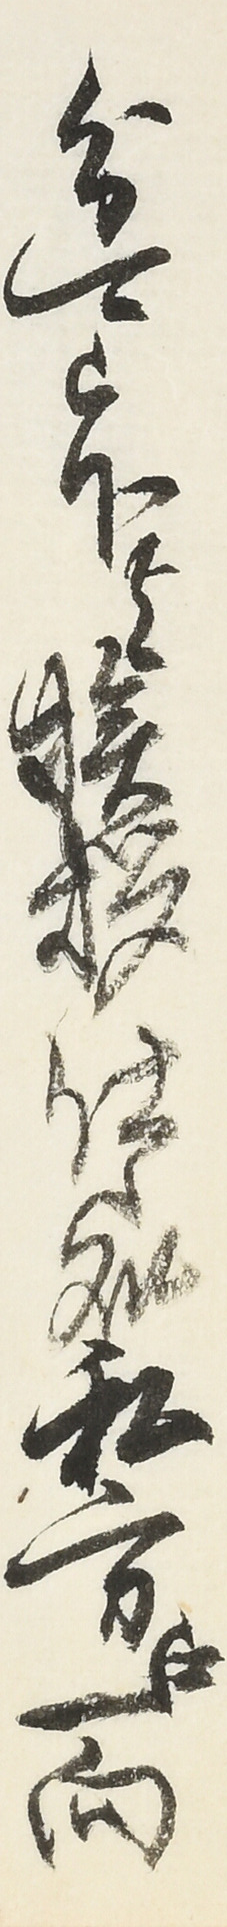分可被下与挨拶仕候処私方江一向
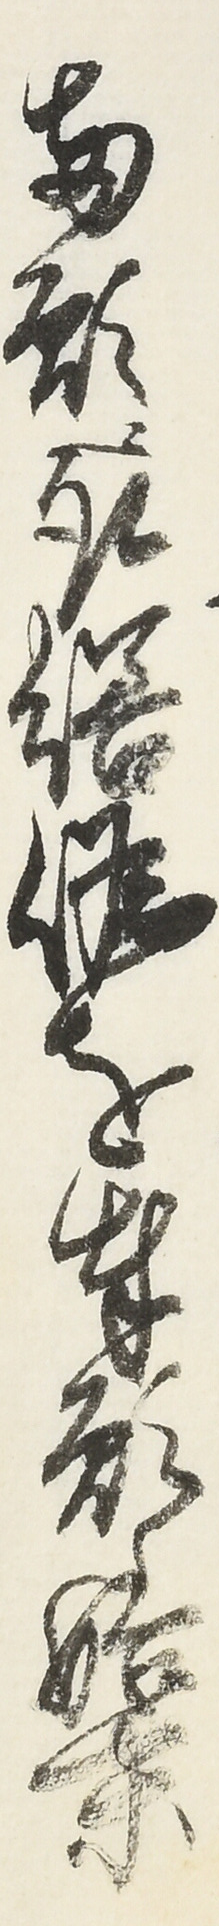両願ニ取繕偽を奉願候始末

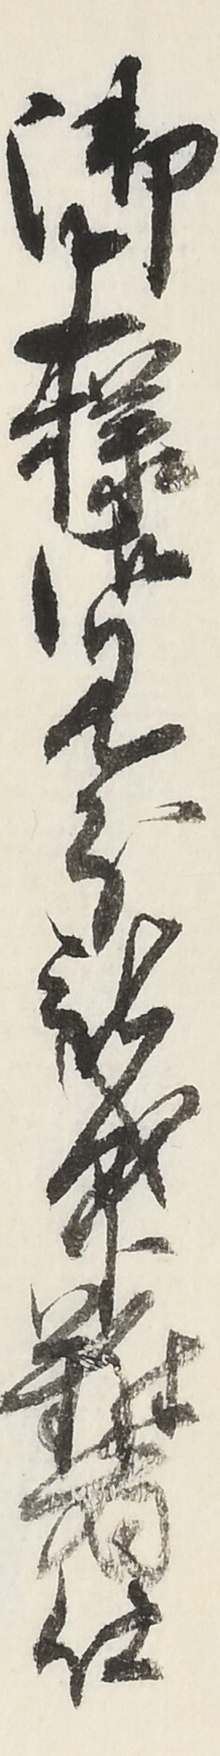御上様御見分被成下難有仕
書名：乍恐御内々子委奉申上度口上書
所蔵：伊那市立高遠町図書館・合同会社AMANE
